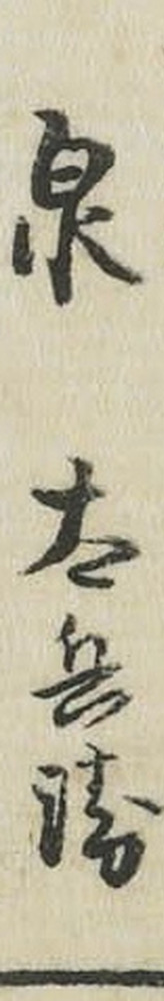泉太兵衛
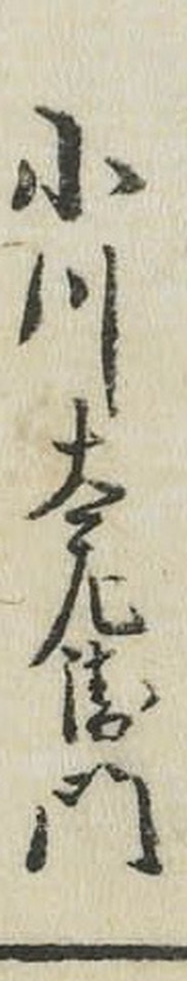小川太左衛門
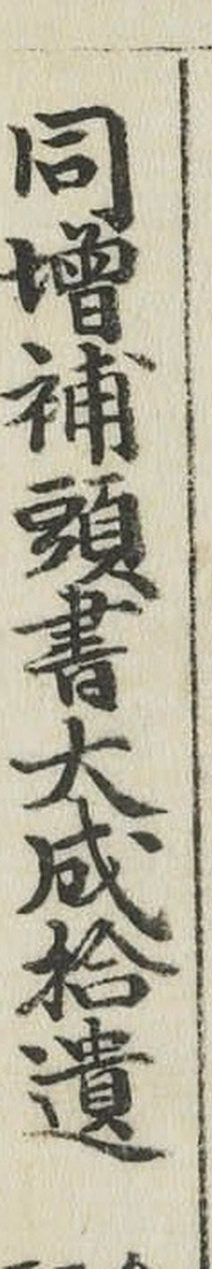同増補頭書大成全十冊
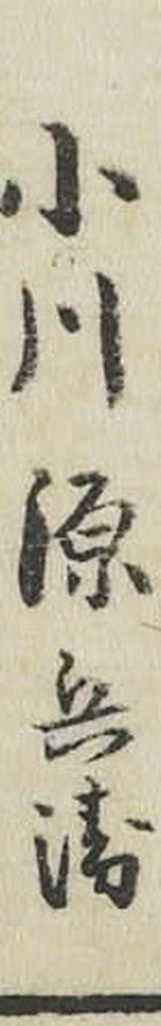小川源兵衛
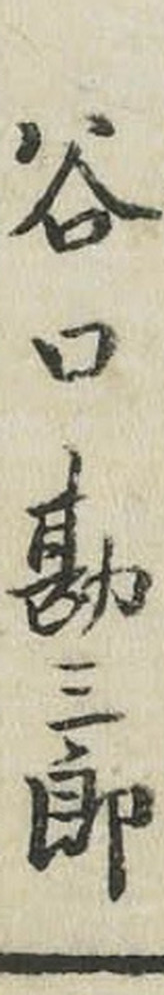谷口勘三郎
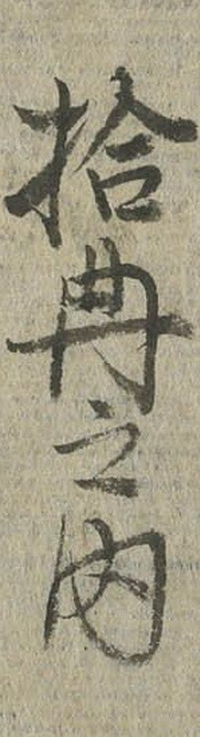拾冊之内
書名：増補頭書訓蒙図彙大成 10巻 10:巻之21
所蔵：東京学芸大学教育コンテンツアーカイブ
